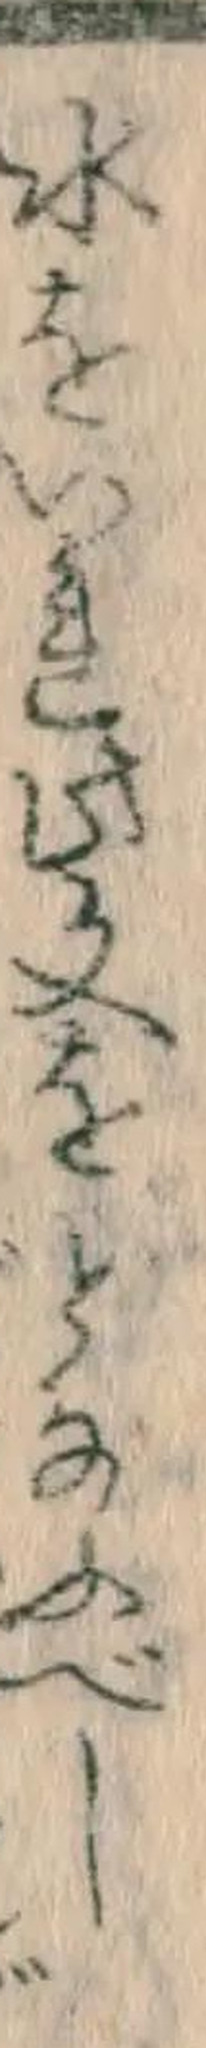水をいれ此文をとなふべし
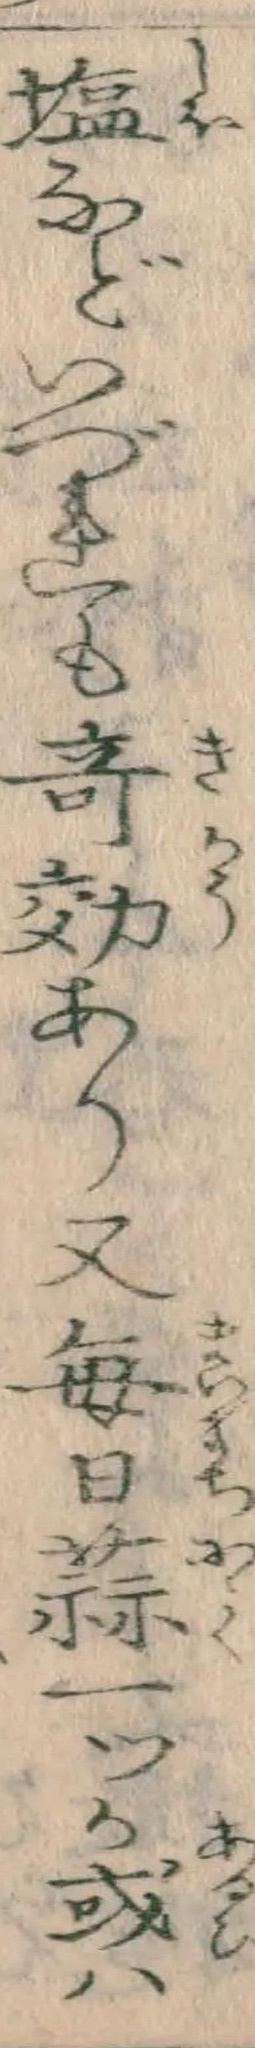塩などいづれも奇効あり又毎日蒜一ッか或は
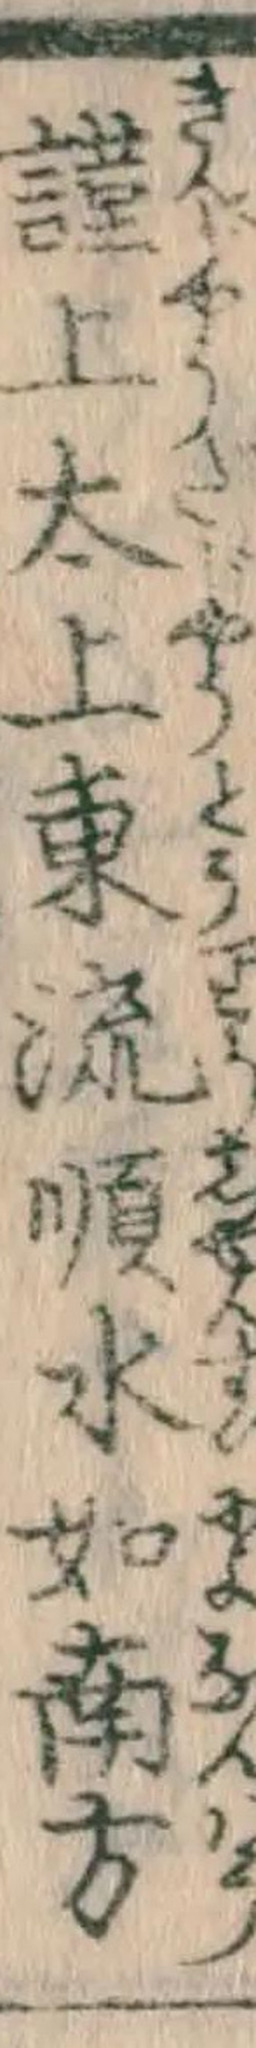謹上太上東流順水如南方
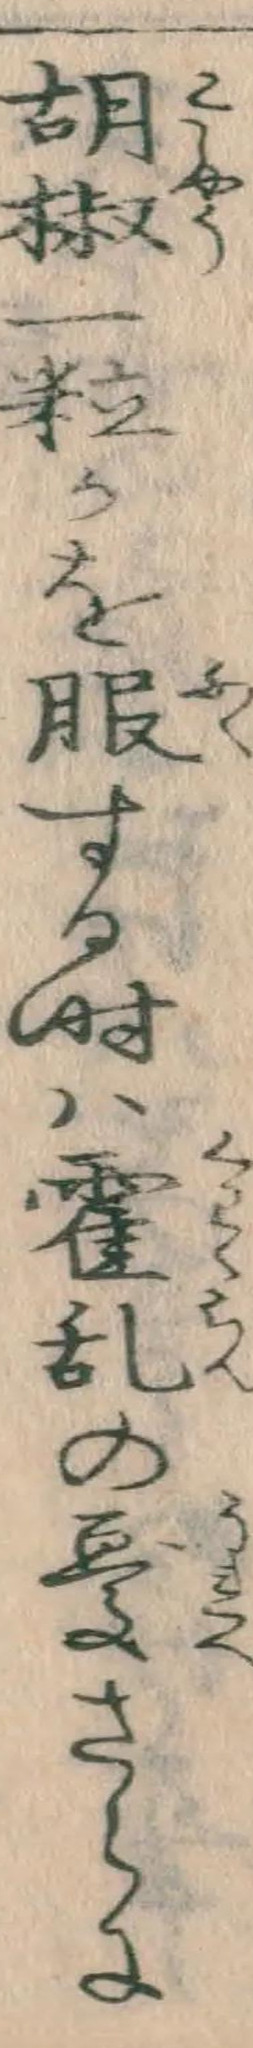胡椒一粒かを服する時は霍乱の憂さらに
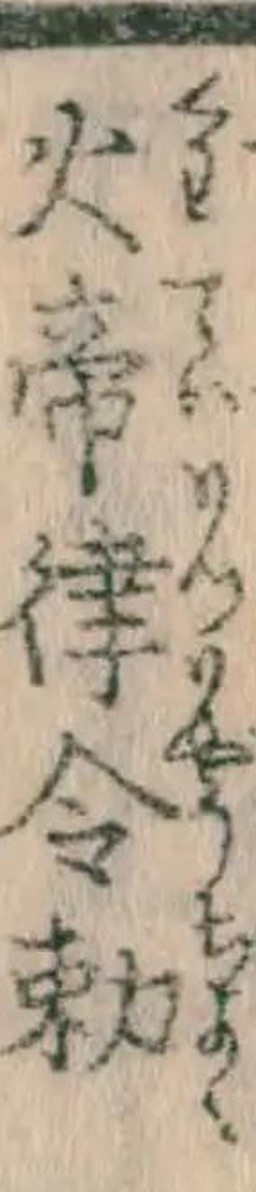火帝律令勅
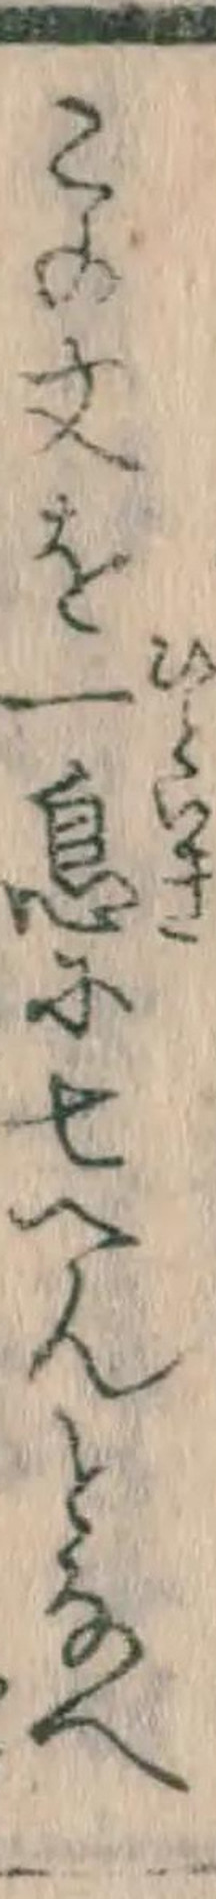この文を一息に七へんとなへ
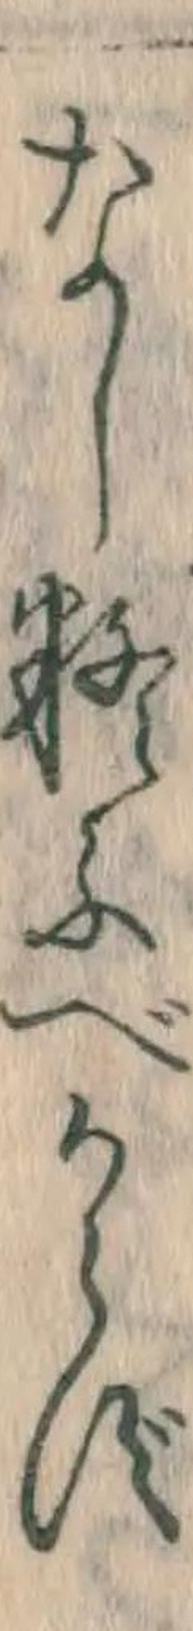なし疑ふべからず
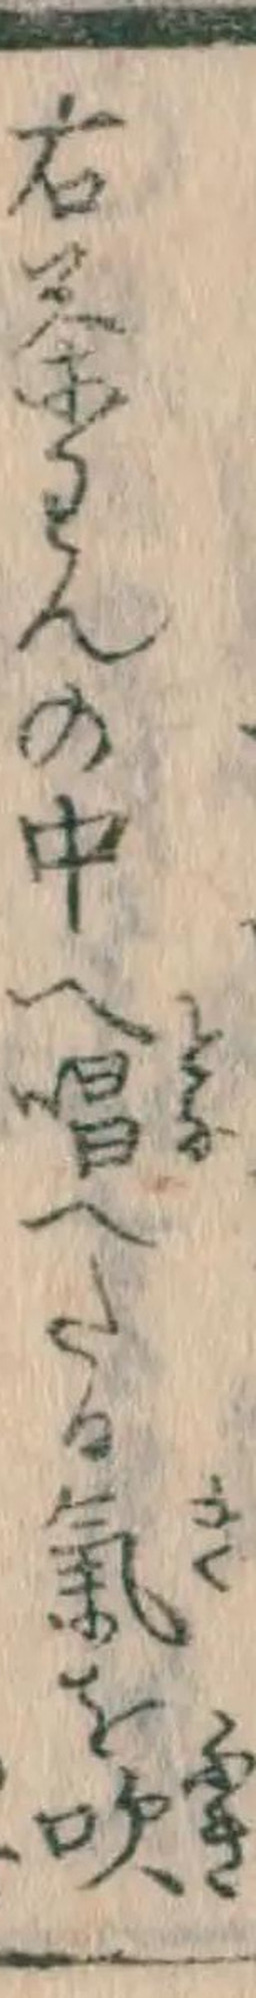右茶わんの中へ唱へたる気を吹
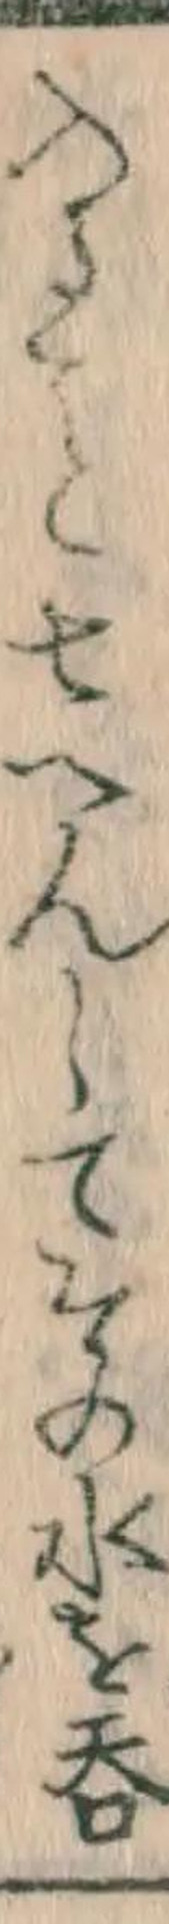入ること七へんしてその水を呑
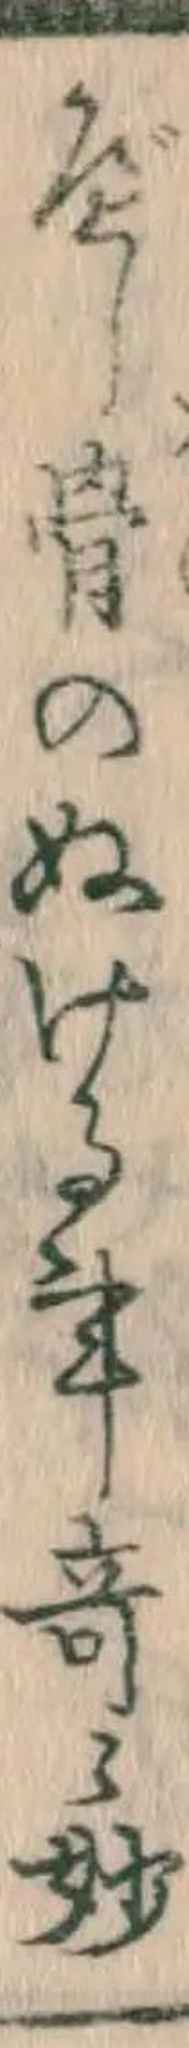べし骨のぬける事奇々妙
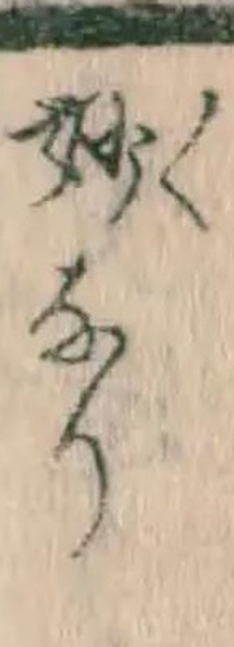妙なり
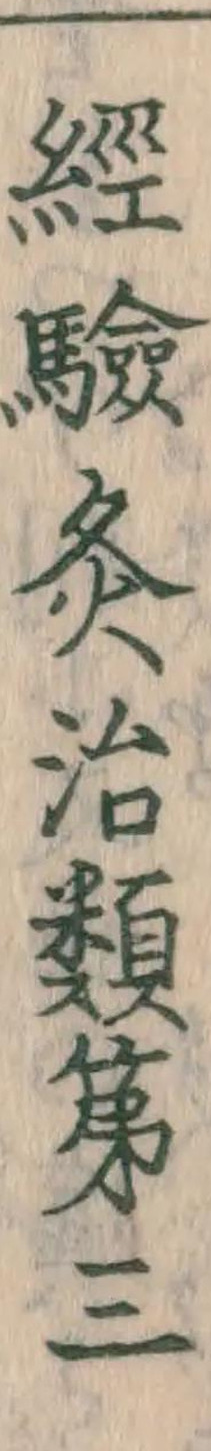経験灸治類第三
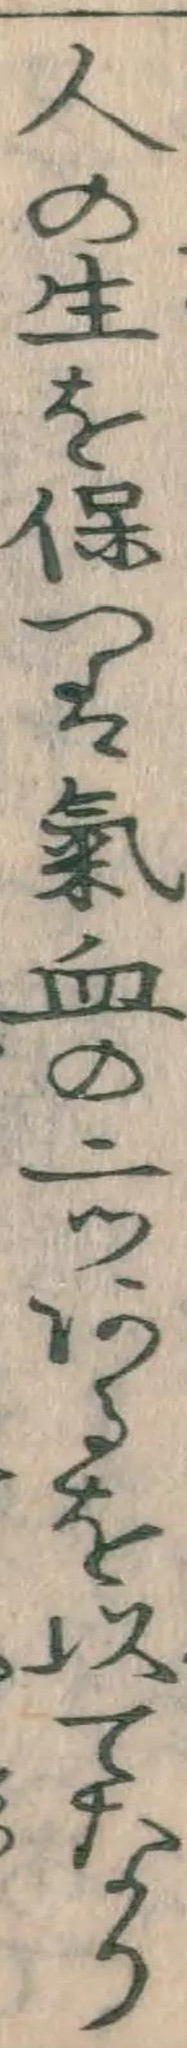人の生を保つは気血の二ッあるを以てなり
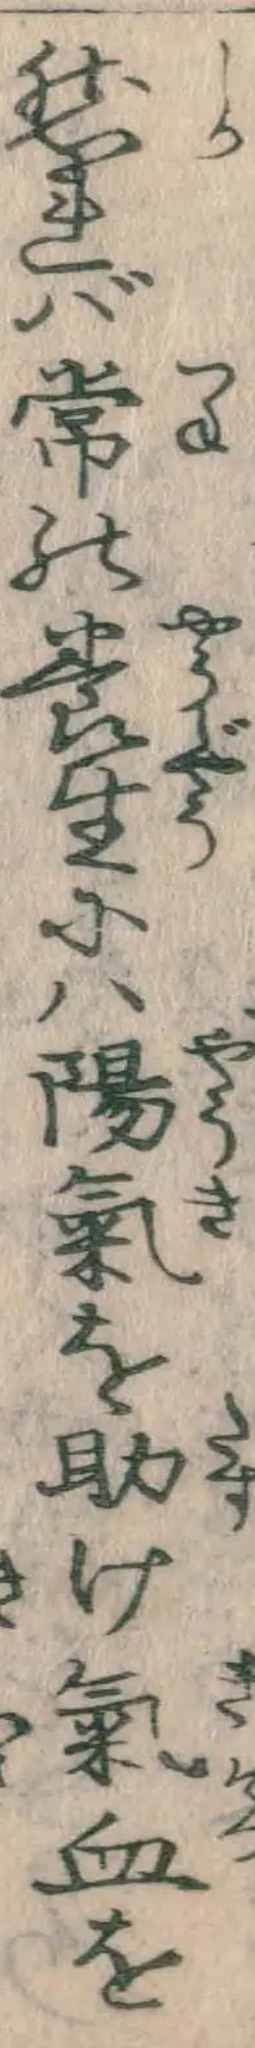然れば常の養生には陽気を助け気血を
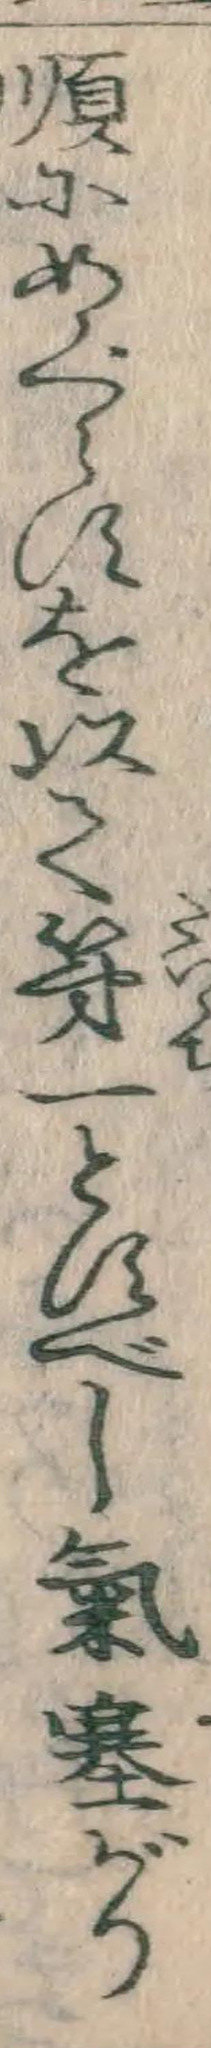順にめぐらすを以て第一とすべし気塞がり
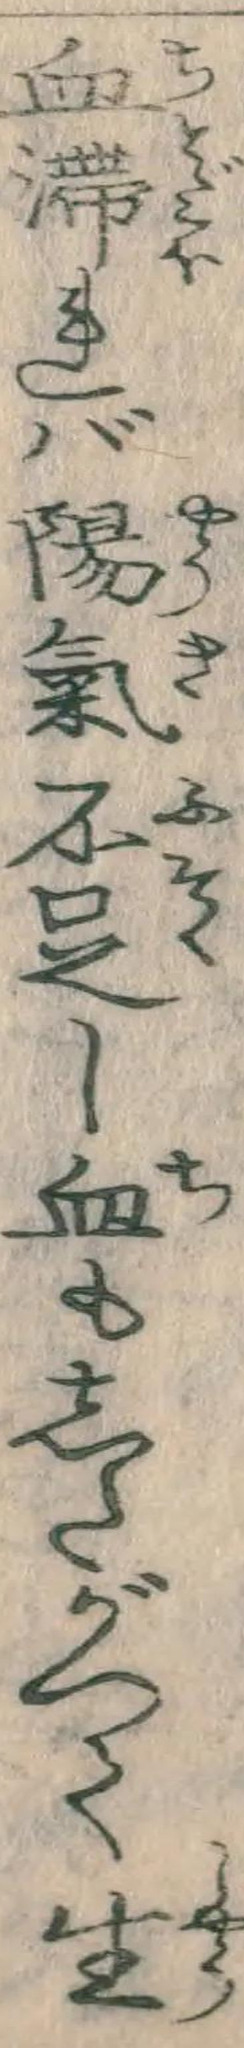血滞れば陽気不足し血もしたがつて生
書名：広益秘事大全 3巻. [4]
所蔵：国立国会図書館 National Diet Library, JAPAN
